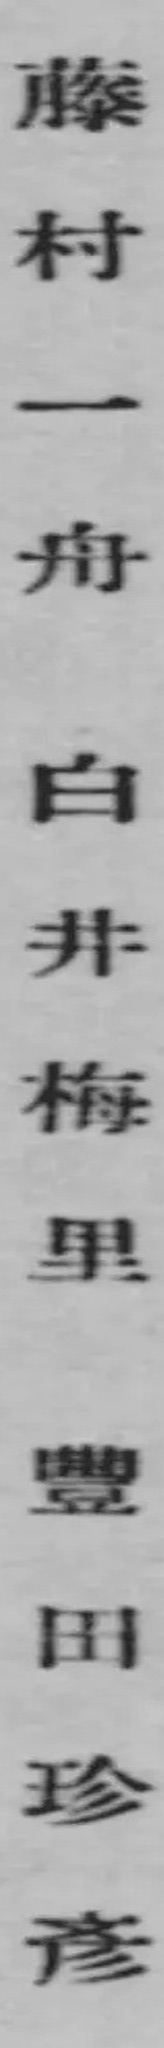藤村一舟白井梅里豐田珍彦
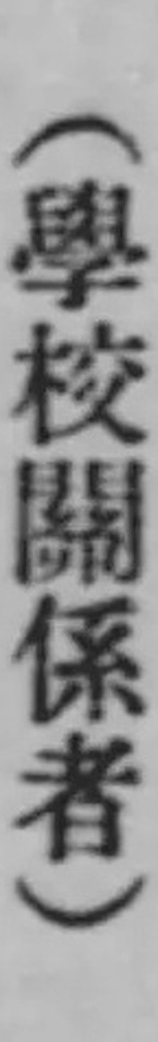(學校關係者)
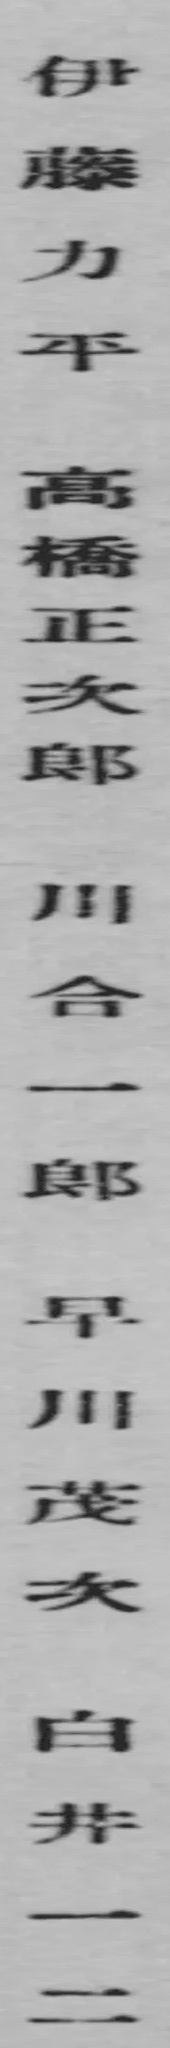伊藤力平高橋正次郎川合一郎早川茂次白井一二
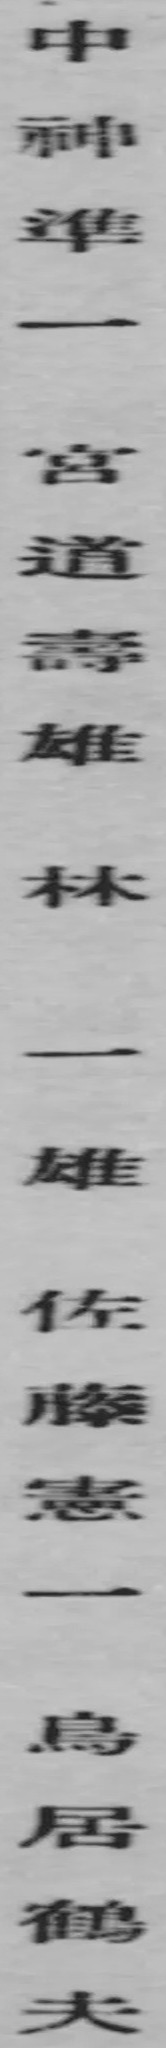中神準一宮道壽雄林一雄佐藤憲一鳥居鶴夫
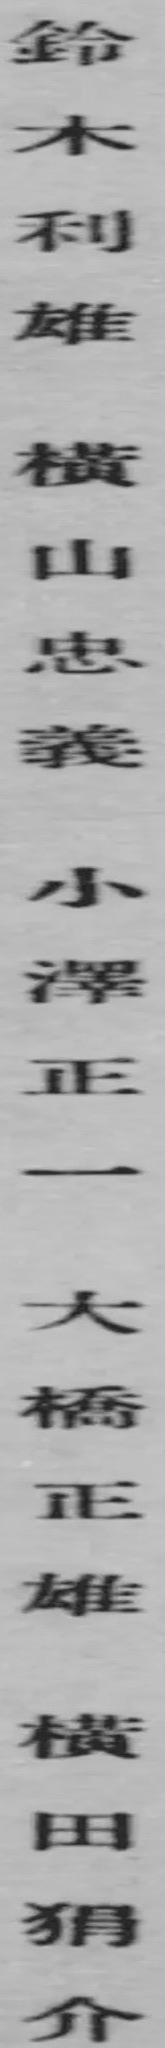鈴木利雄横山忠義小澤正一大橋正雄横田狷介
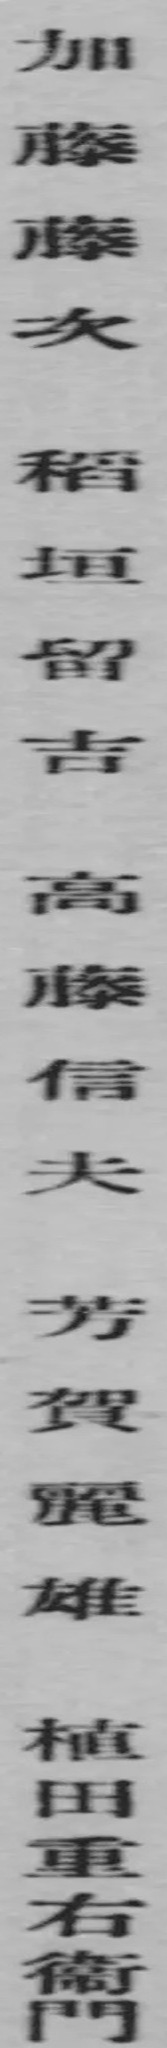加藤藤次稻垣留吉高藤信夫芳賀麗雄植田重右衞門
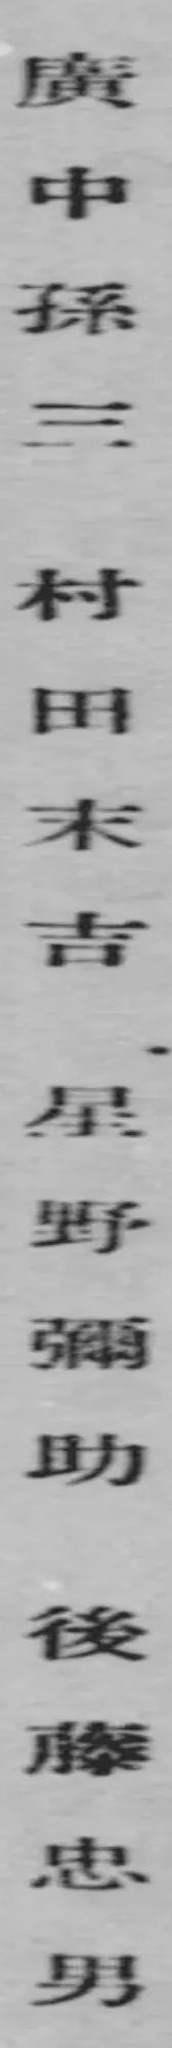廣中孫三村田末吉星野彌助後藤忠男
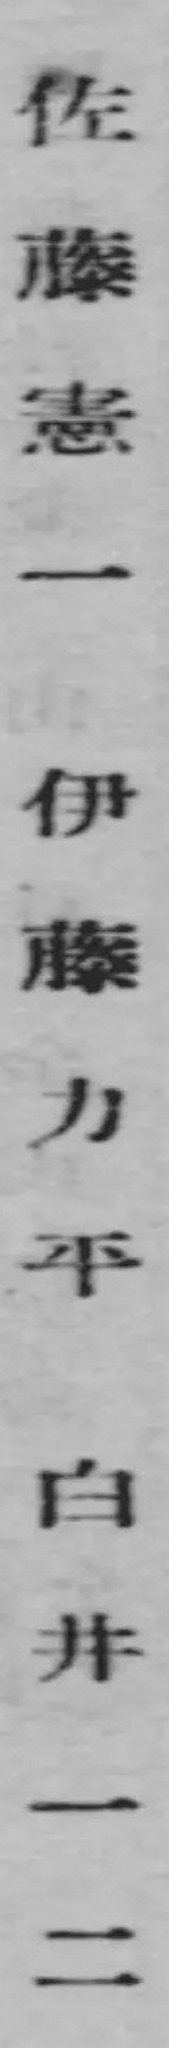佐藤憲一伊藤力平白井一二
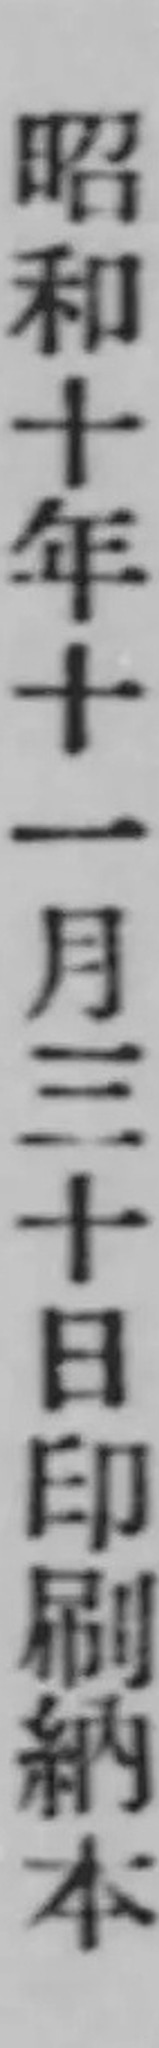┃昭和十年十一月三十日印刷納本┃
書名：豊橋の年中行事
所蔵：国立国会図書館 National Diet Library, JAPAN
